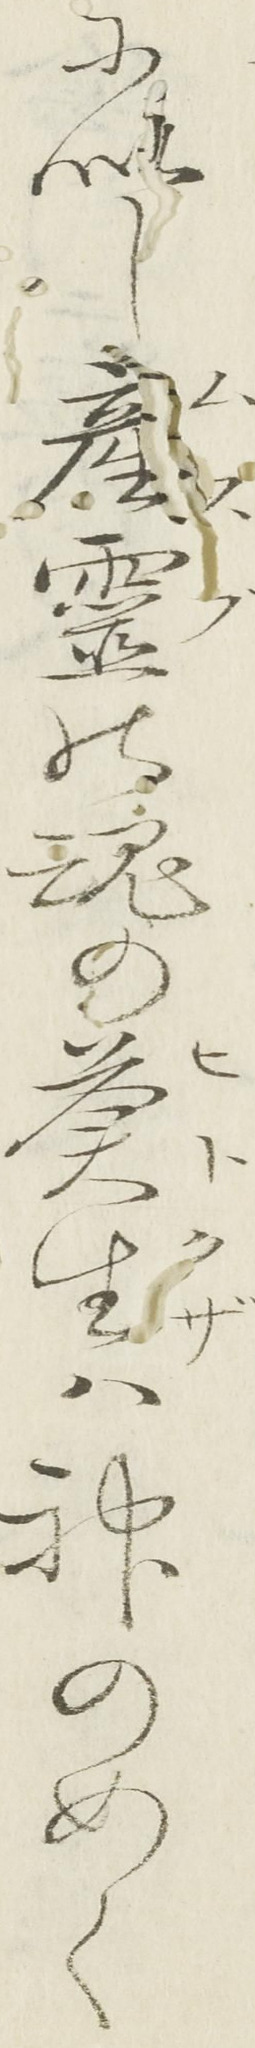に似し産霊の魂の蒼生は神のめく
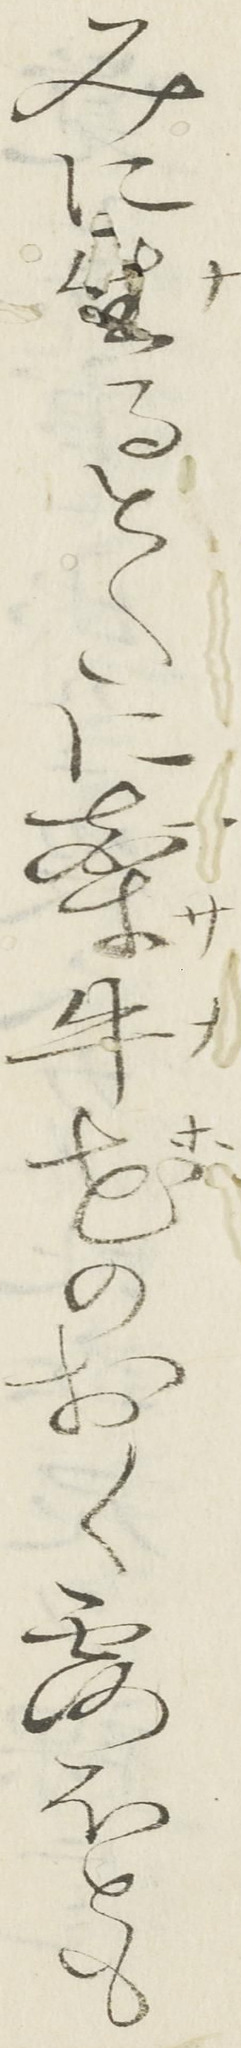みに生るとたに牽牛花のおく露ほとも
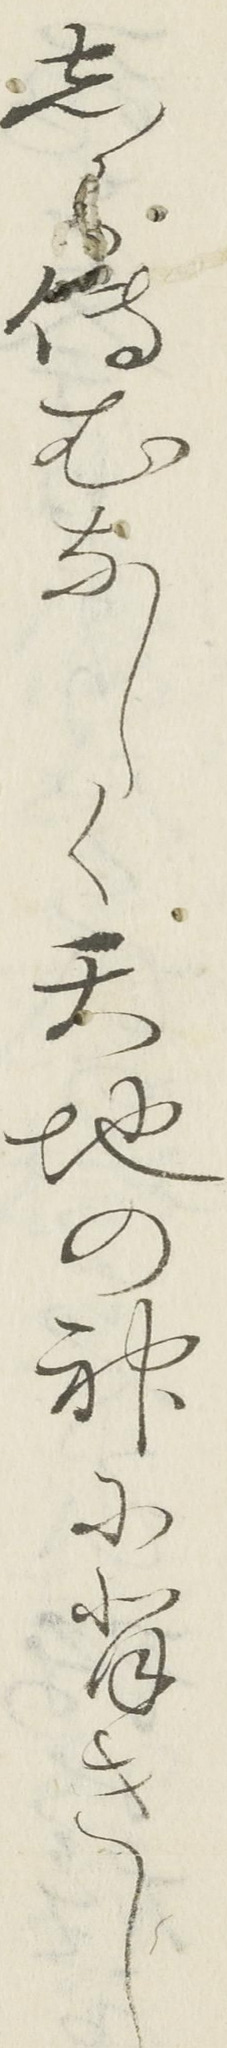しらてむなしく天地の神に背きし
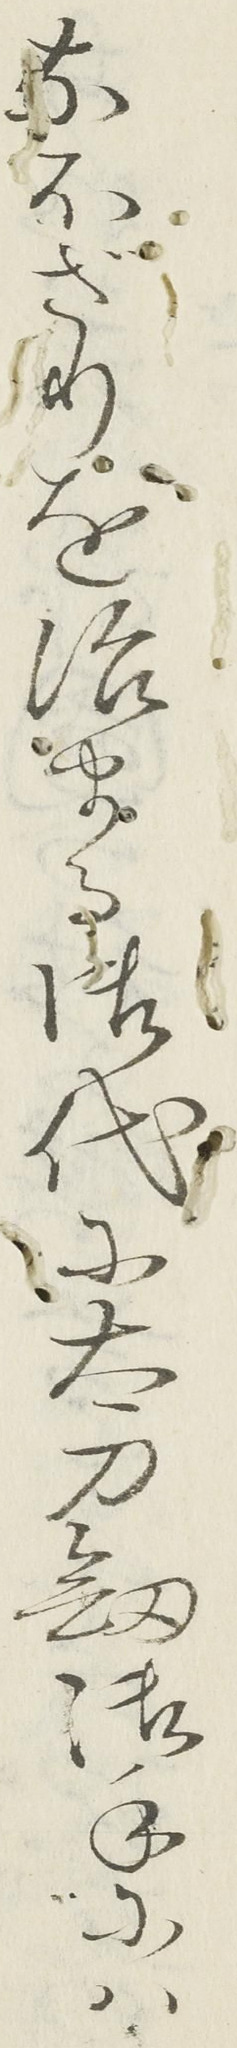なほざりを治まる御代に太刀劔御手には
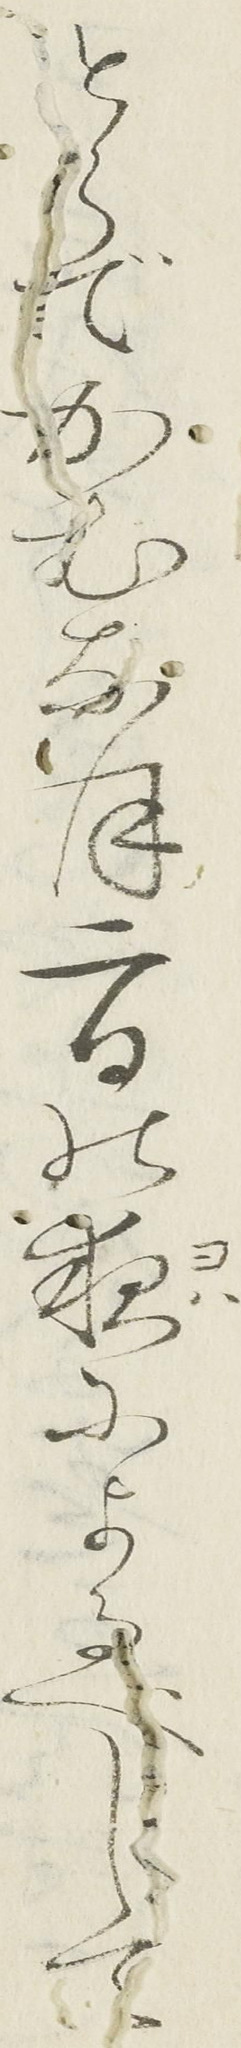とらでかむな月二日の夜によるべして
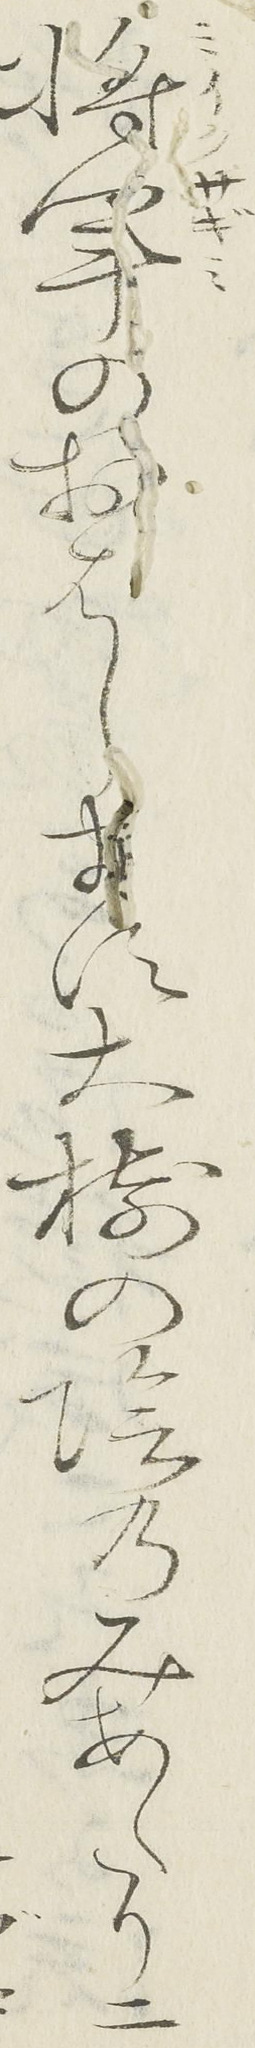将軍のおはします大樹の陰のみあたりに
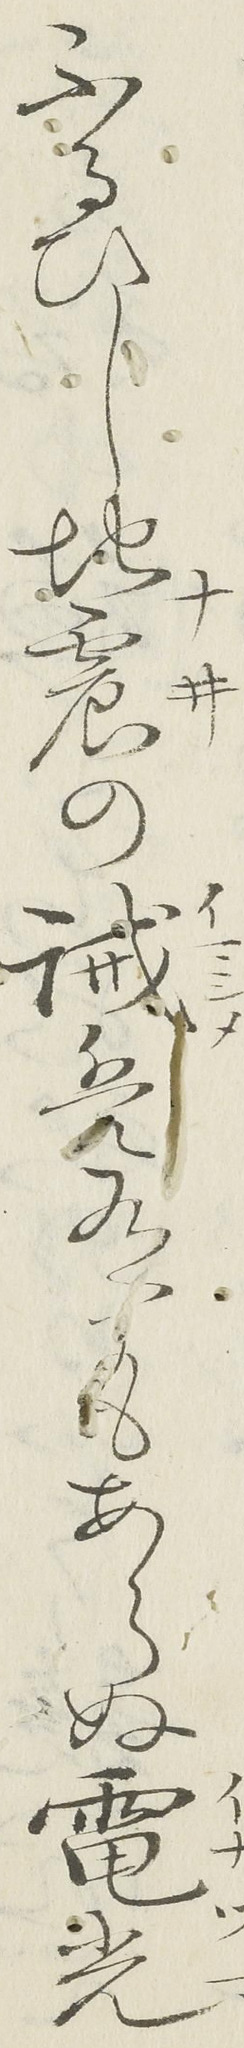ふるひし地震の誡は有にもあらぬ雷光
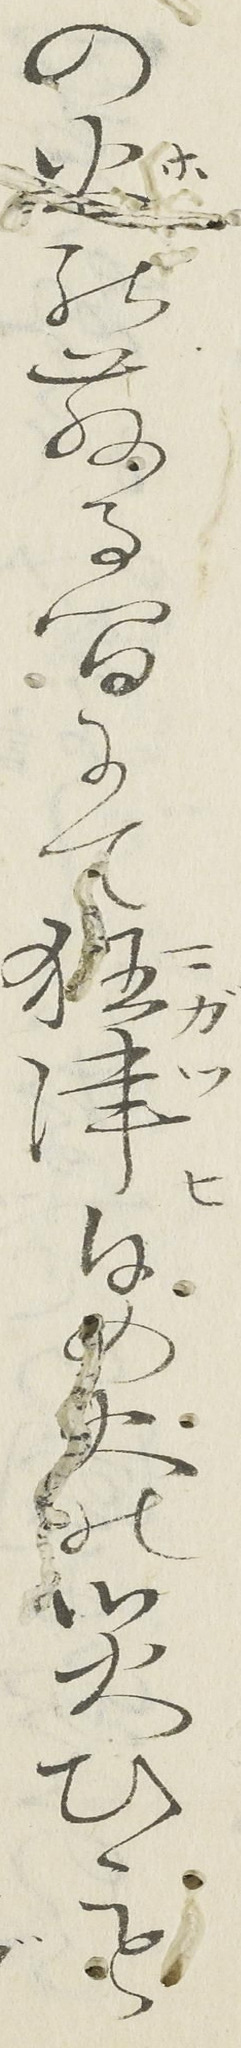の火の散る間にて狂津日の災ひこと
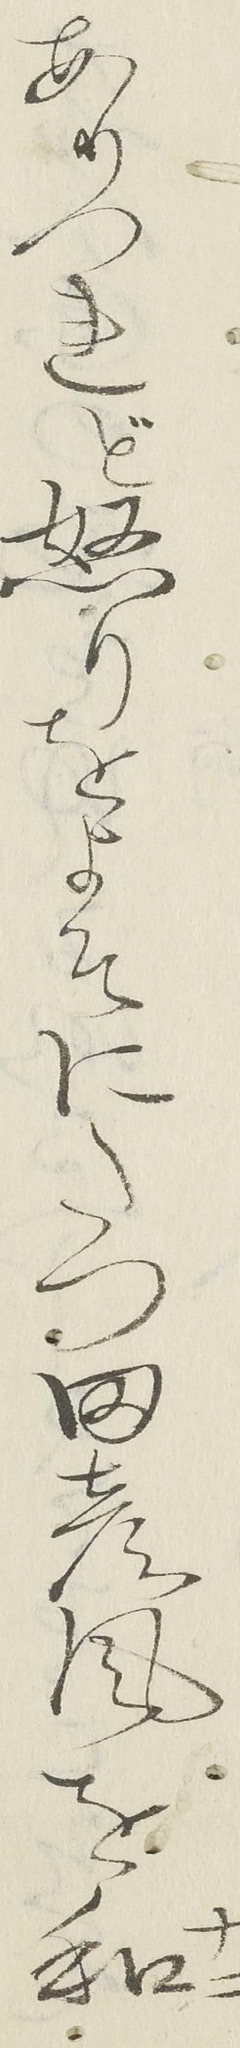ありつれど怒りをよそにたつ田彦風を和
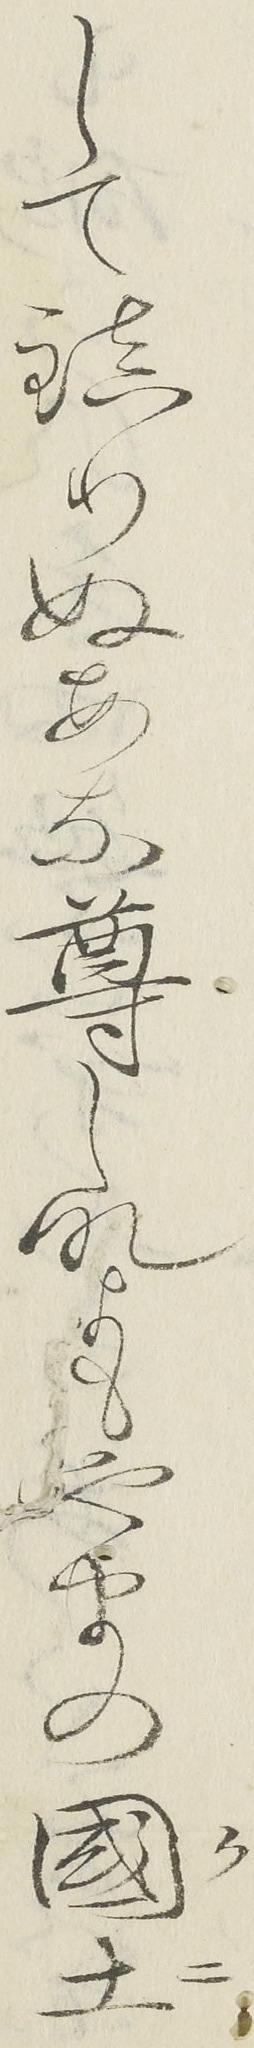して鎮りぬあな尊しなよりもやまの國土

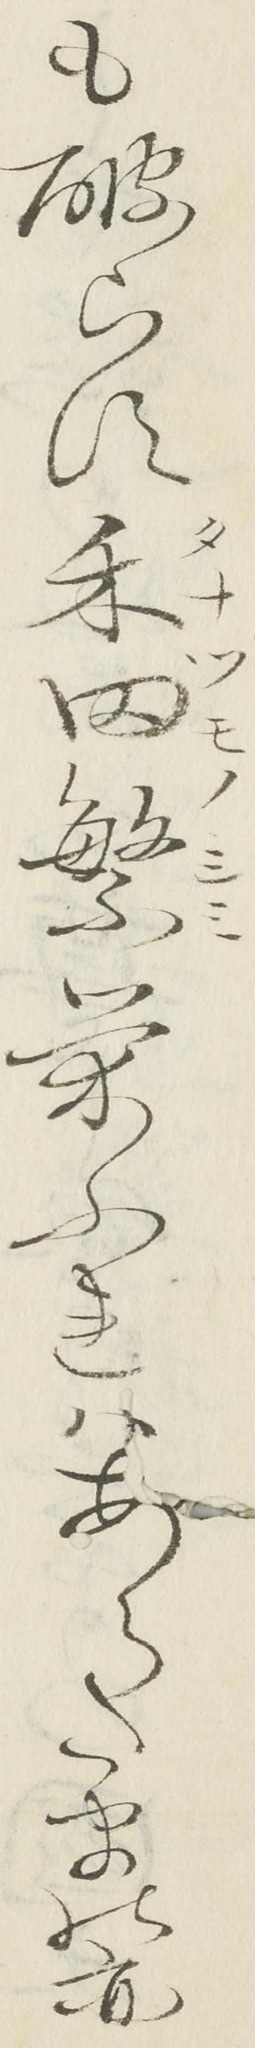も破らす禾田繁栄ふれはあらたまの亦
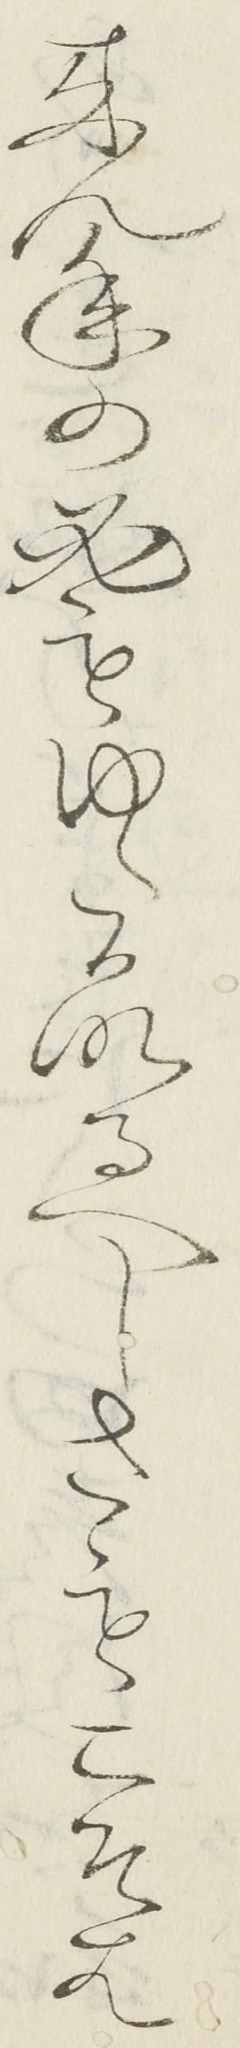来ん年の必もゆたかなるへしさもこそは
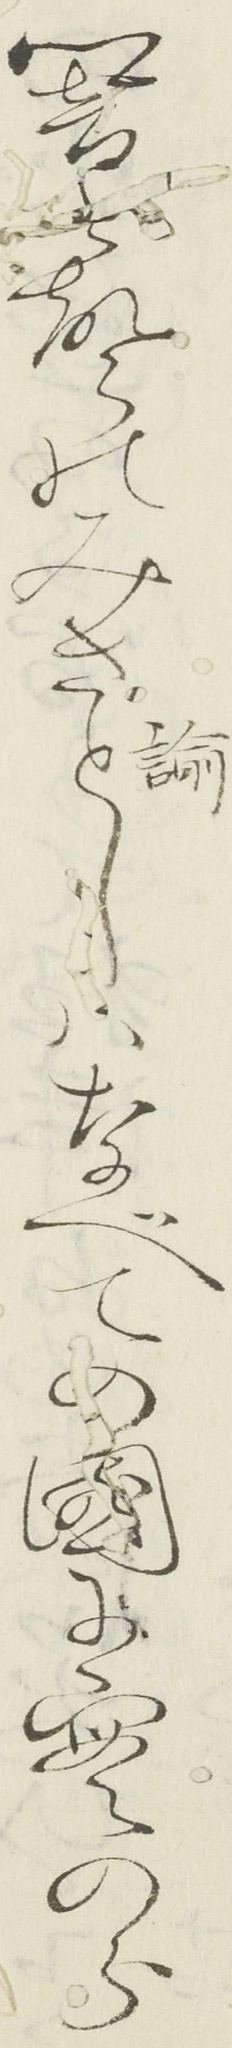闇も故らのみさとしはなべての国に実のら
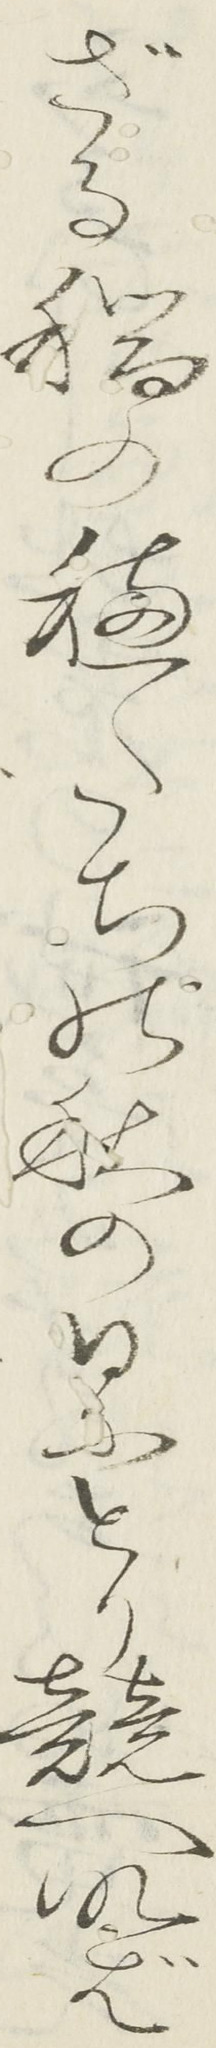ざる稲の穂たちの秋の日にとり競へれば
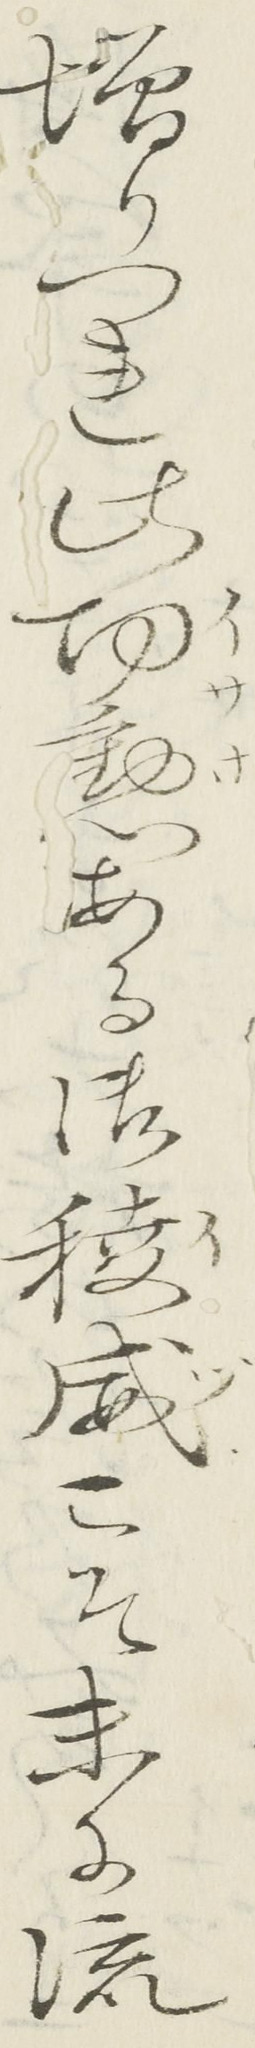増りつれ此功勲ある御稜威こそ末に流
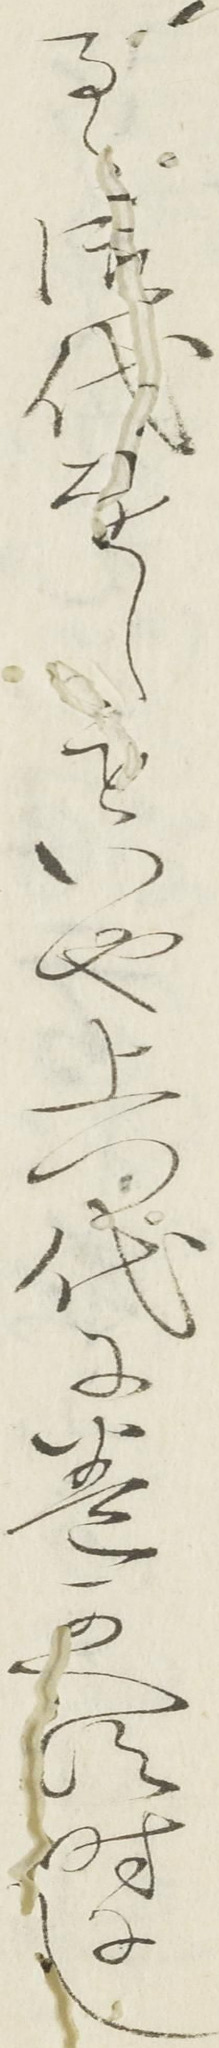るゝ御代をしもいや上つ代に巻かへす時にし
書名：地震考證　全
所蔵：東京大学地震研究所図書室 Earthquake Research Institute Library, The University of Tokyo, JAPAN
